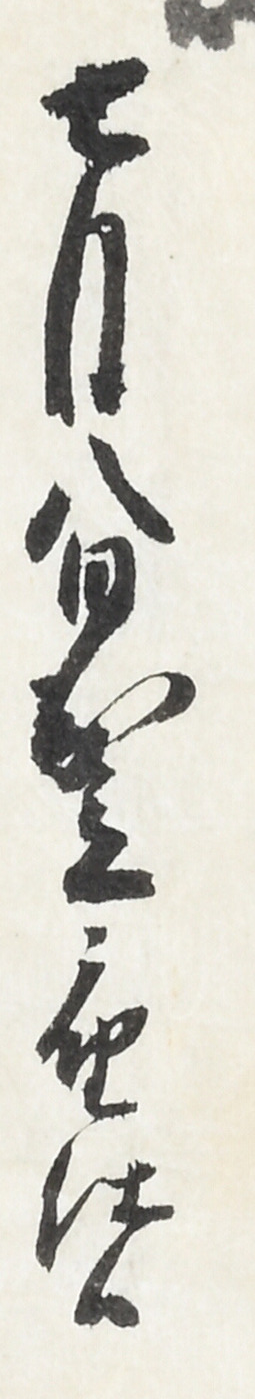七月八日出立届仕候

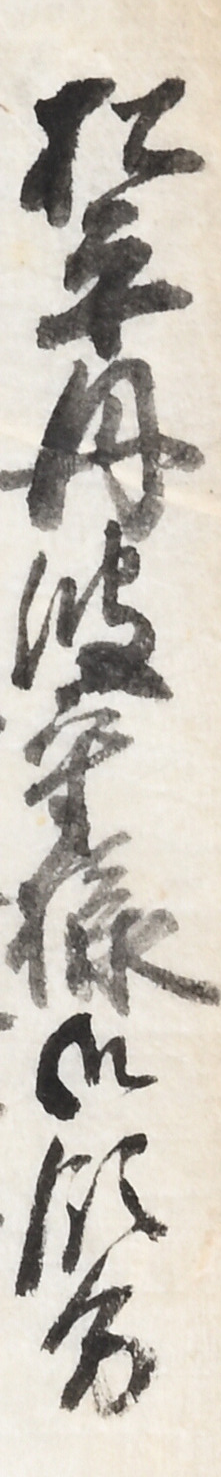松平丹波守様御領分
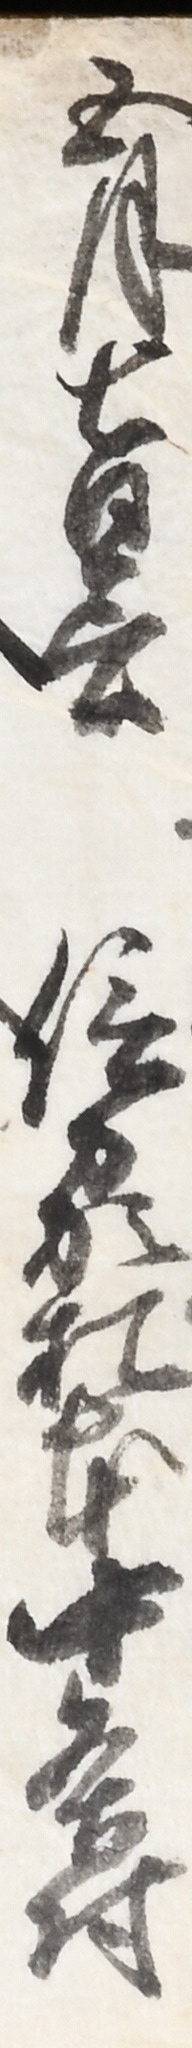五月七日着信州松本中条村
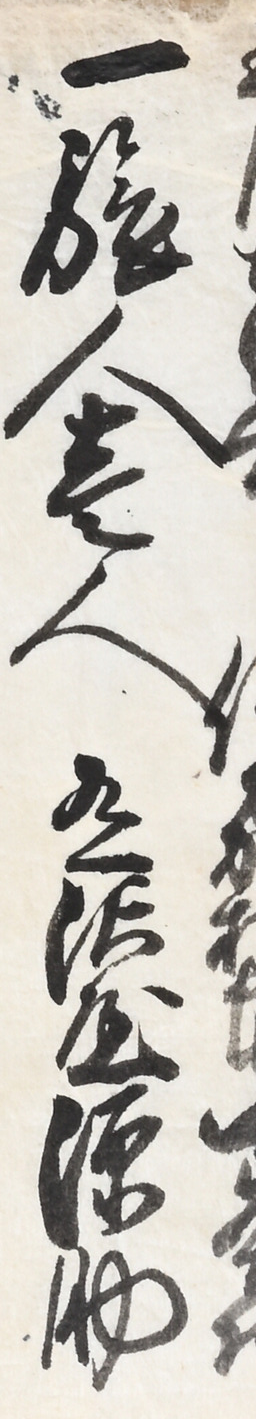一旅人壱人有沢屋源助
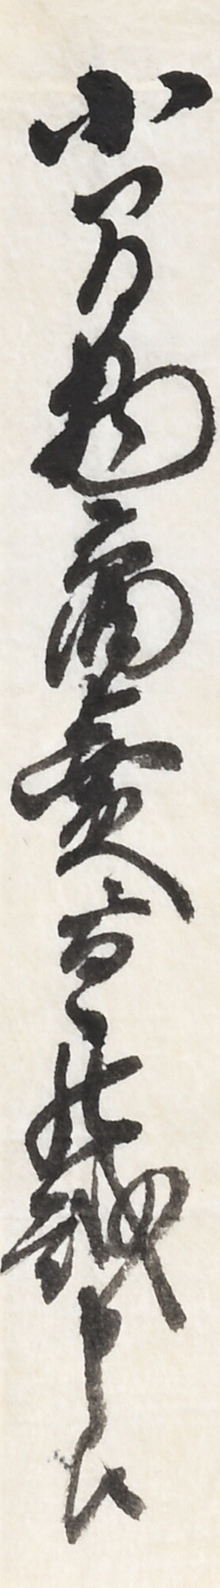小間物商売ニ而罷越申候
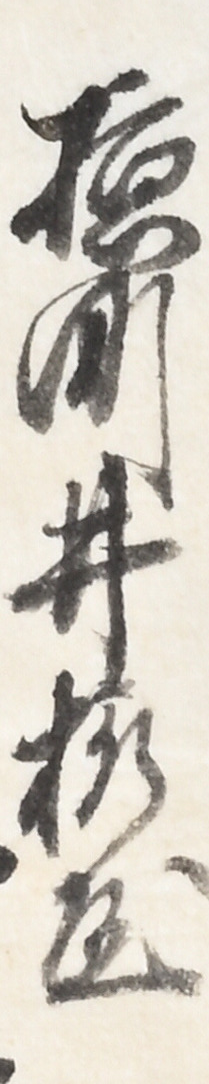横町井桁屋
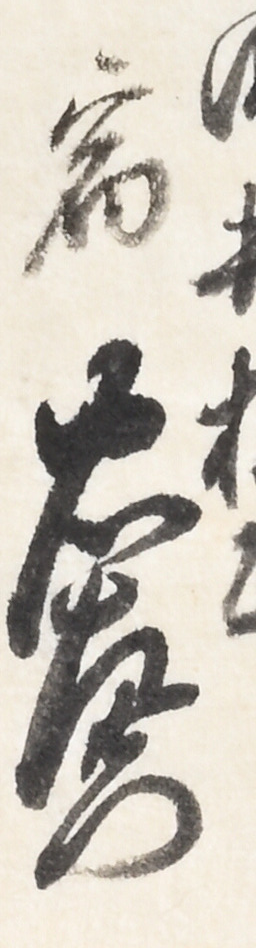宿忠左衛門
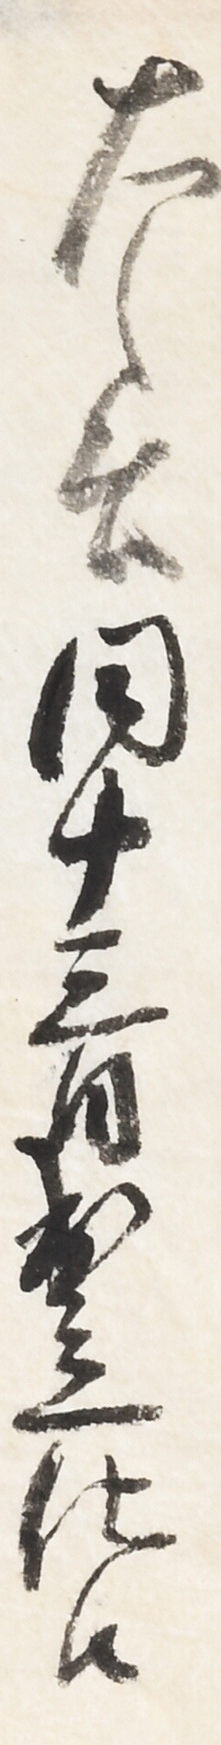右之者同十三日出立仕候
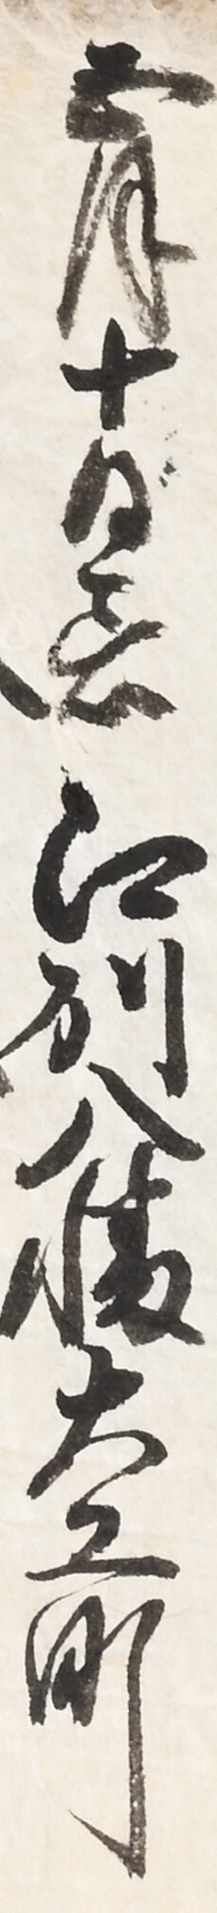五月十日着江州八幡大工町
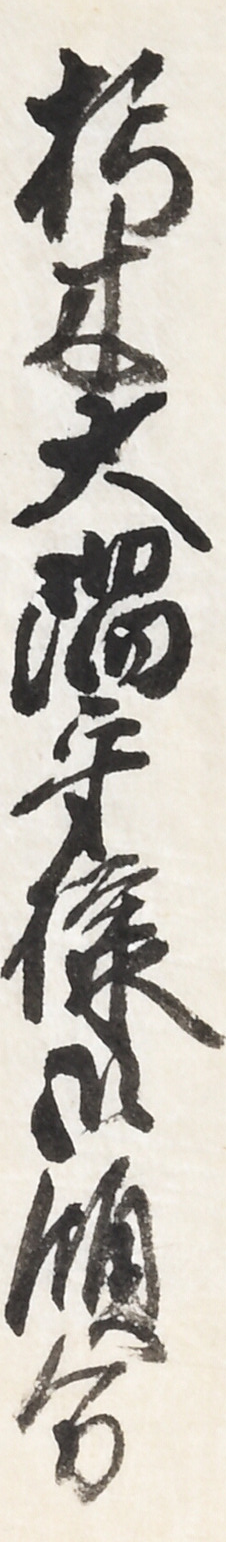朽木大隅守様御領分
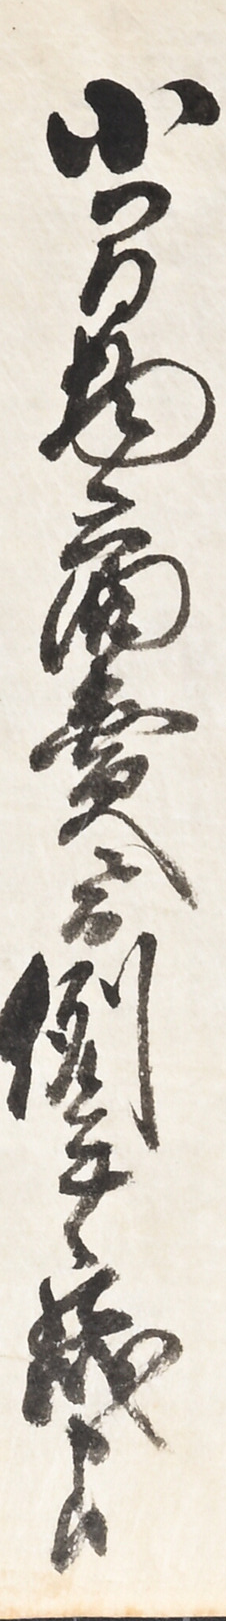小間物商売ニ而例年罷越申候
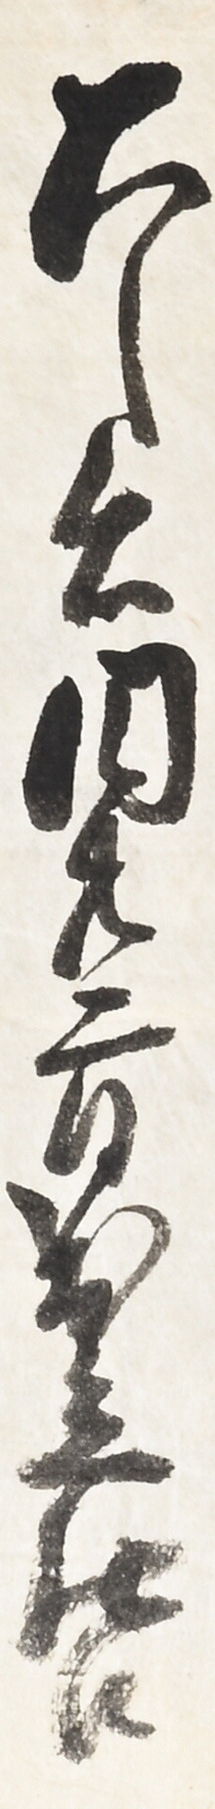右之者同廿二日出立仕候
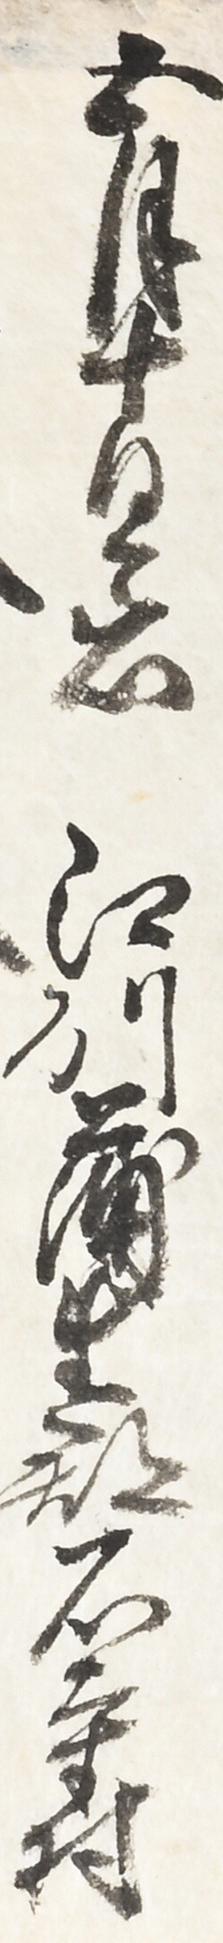五月十日着江州蒲生郡石寺村
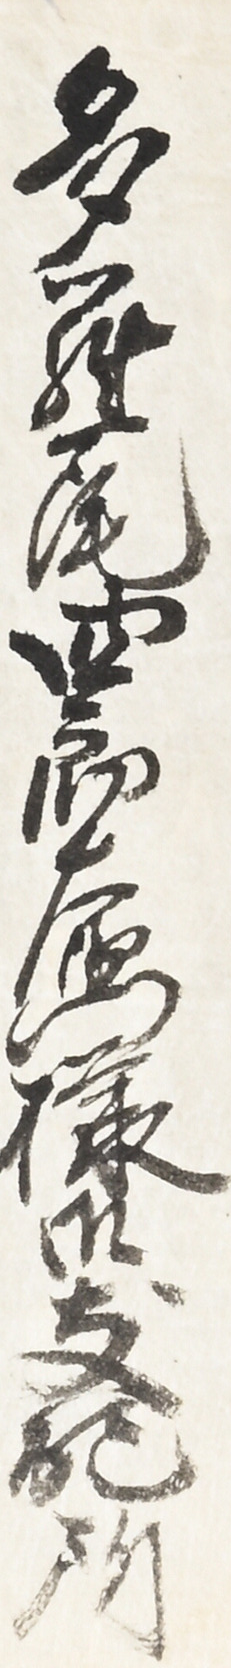多羅尾四郎右衛門様御支配所
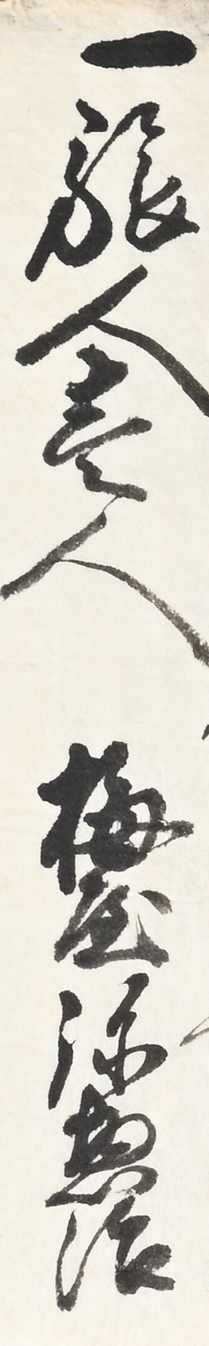一旅人壱人梅屋弥惣治
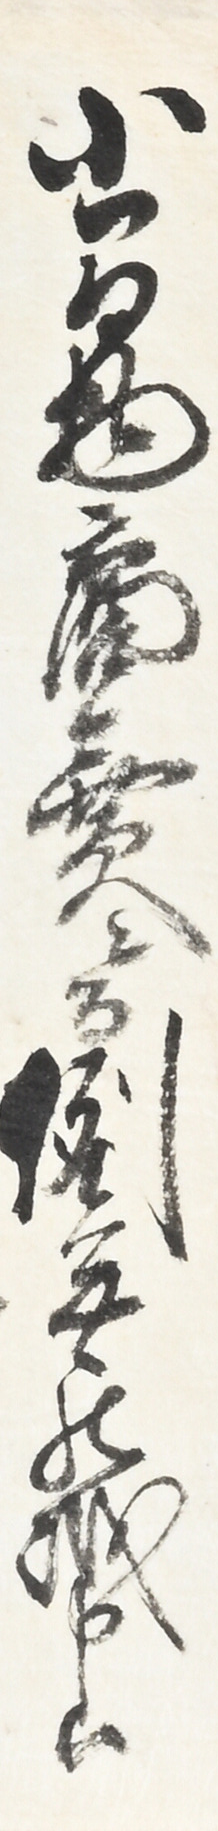小間物商売ニ而罷越申候
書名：旅人泊控帳
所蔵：伊那市立高遠町図書館・合同会社AMANE
